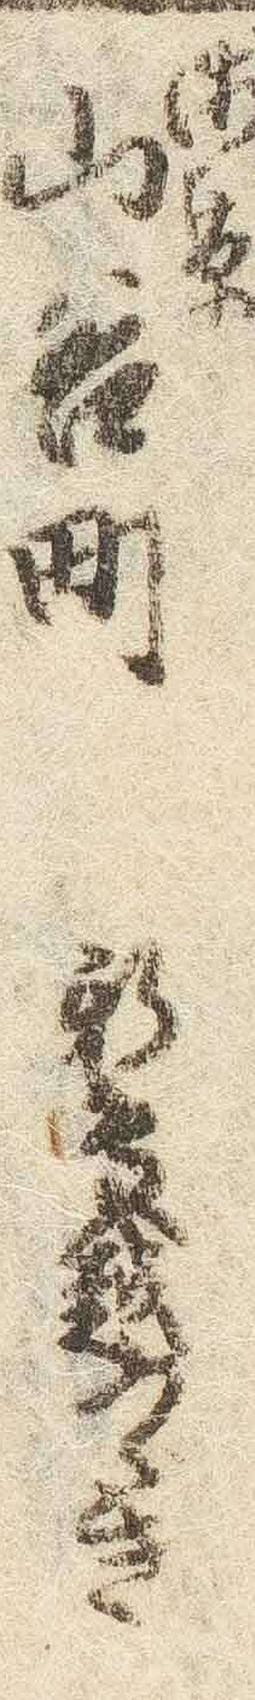山谷町新鳥越つゞき
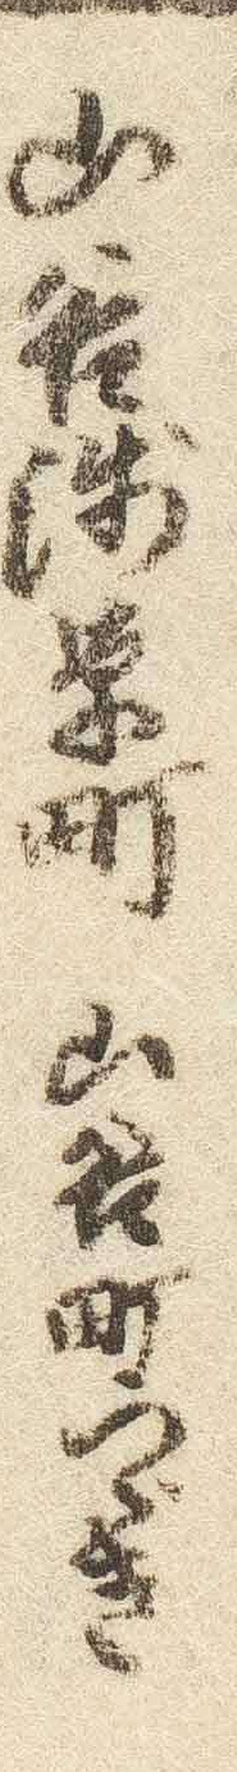山谷浅草町山谷町つゞき
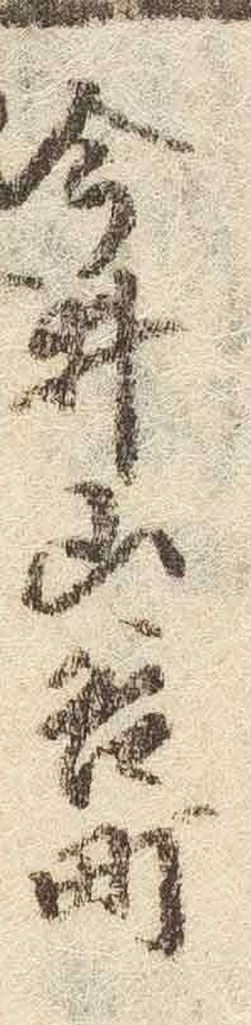今井山谷町
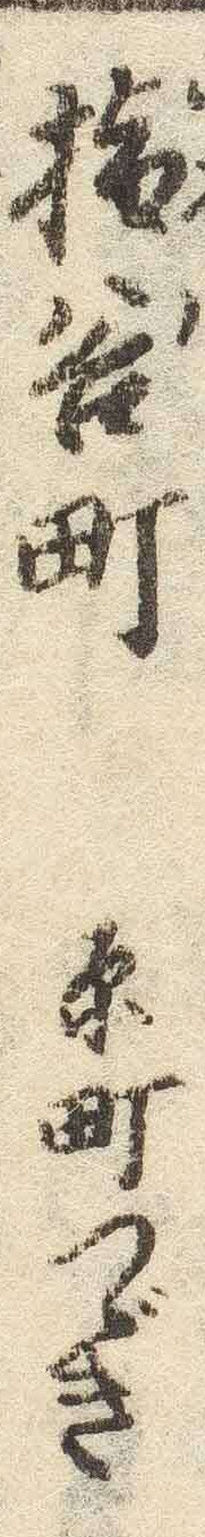指谷町原町つゞき
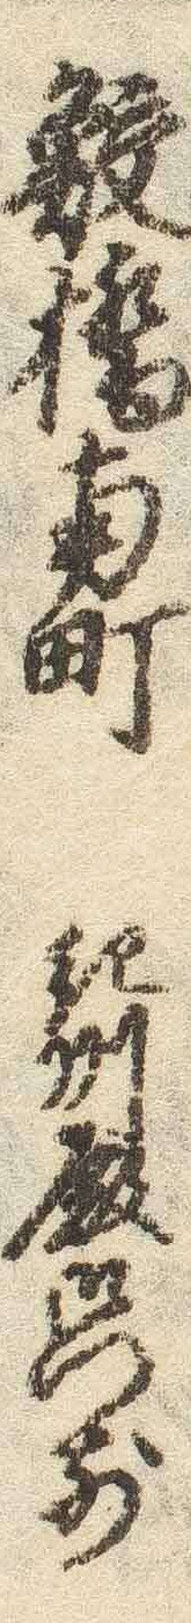鮫橋南町紀州殿御門前
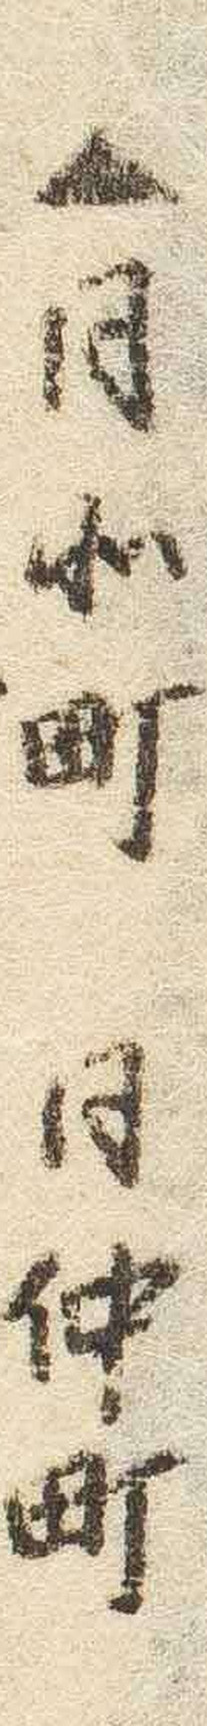▲同北町同仲町
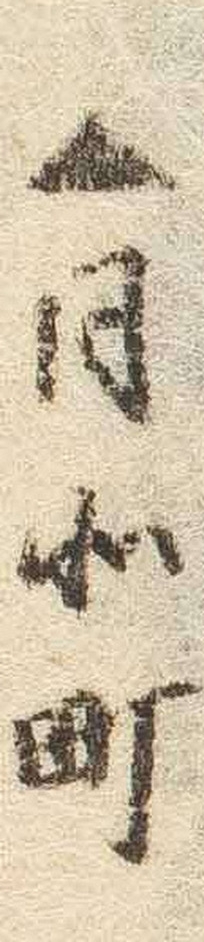同表町
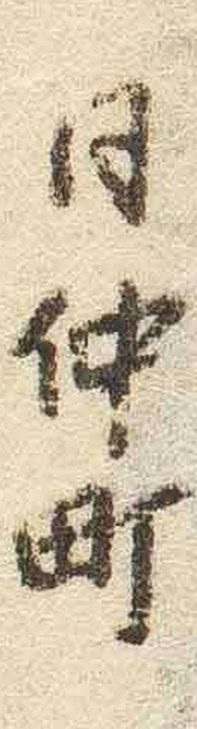同表町
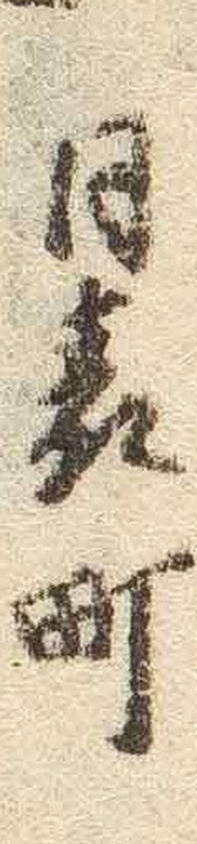同表町
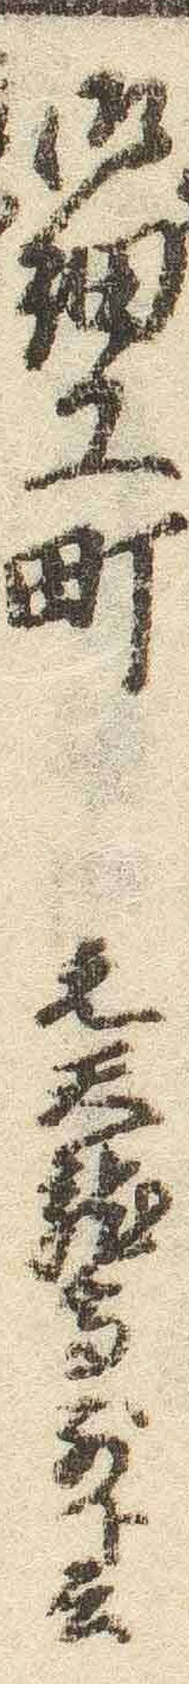御細工町元天龍寺前ト云
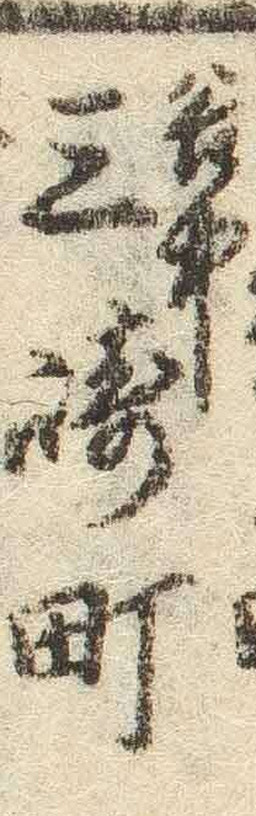三崎町
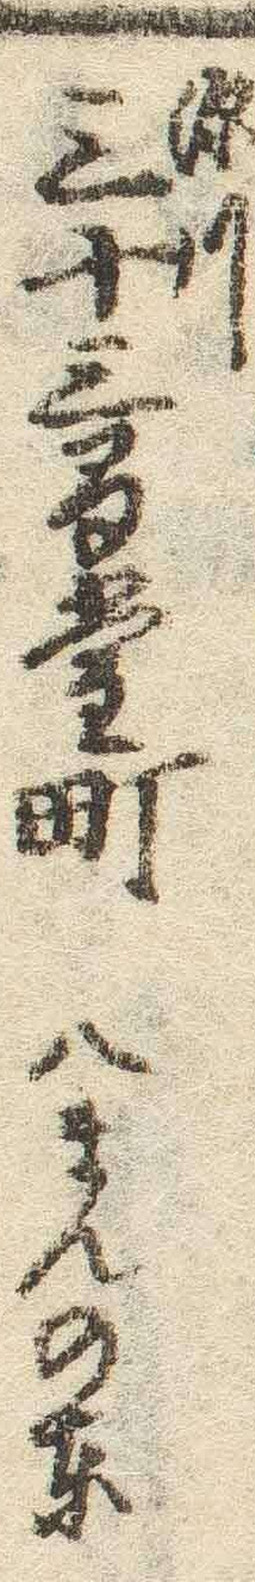三十三間堂町八まんの東
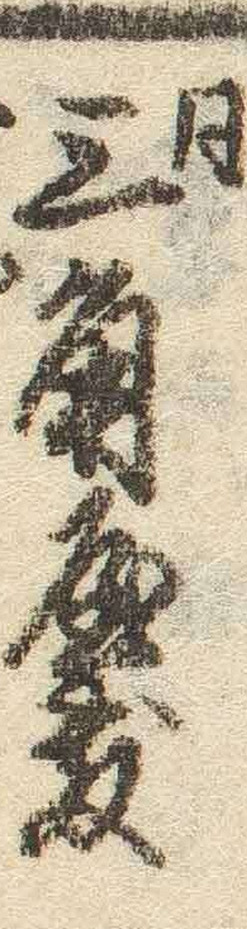三軒屋敷
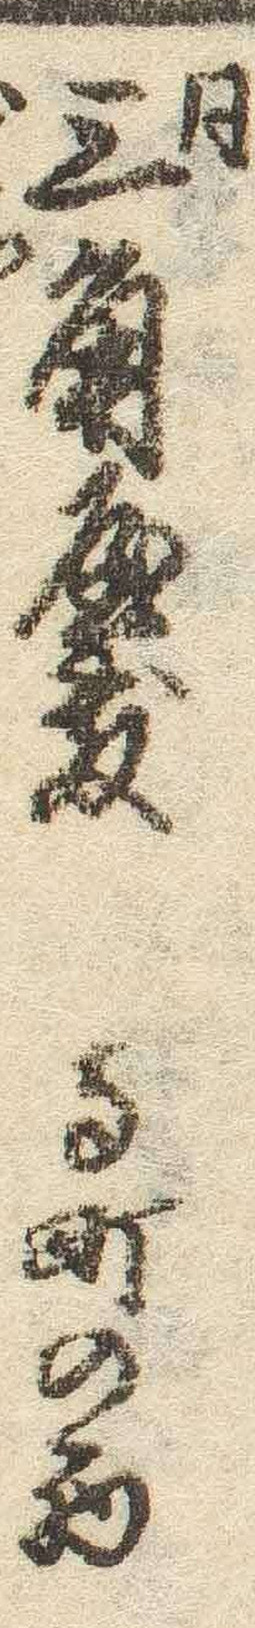三角屋敷寺町の西
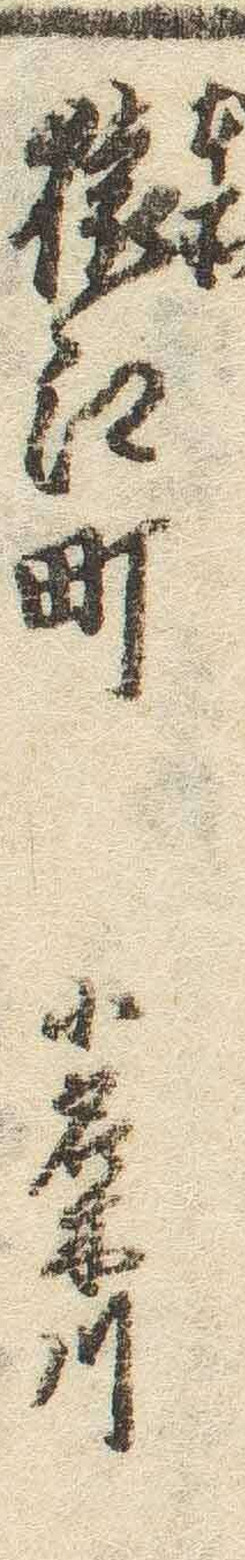猿江町小名木川
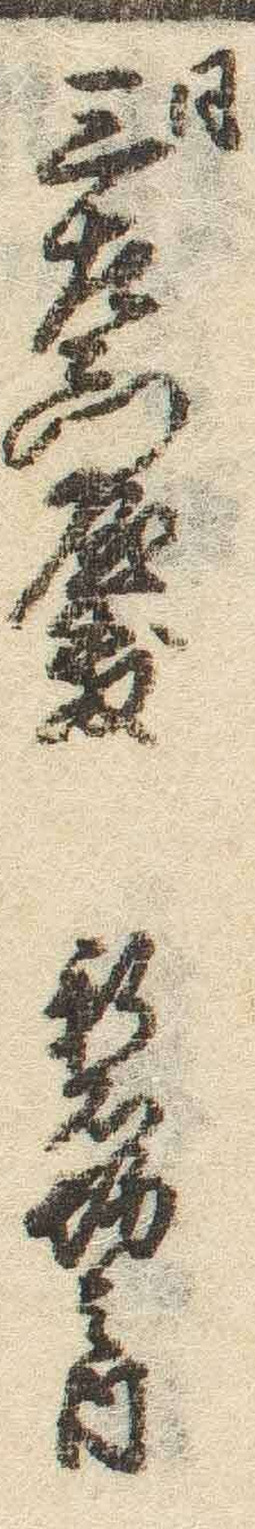三左衛門屋敷新石場之内
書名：江戸町独案内
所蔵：東京学芸大学附属図書館 国文学研究資料館
